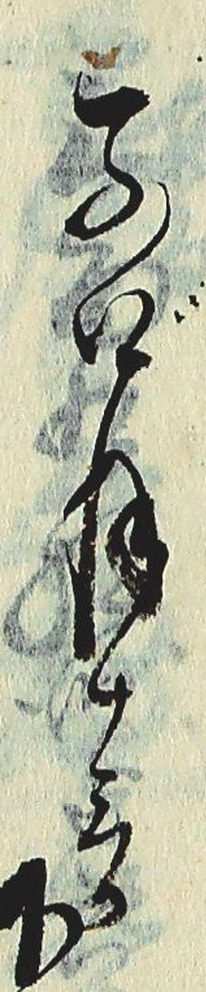子四月十三日
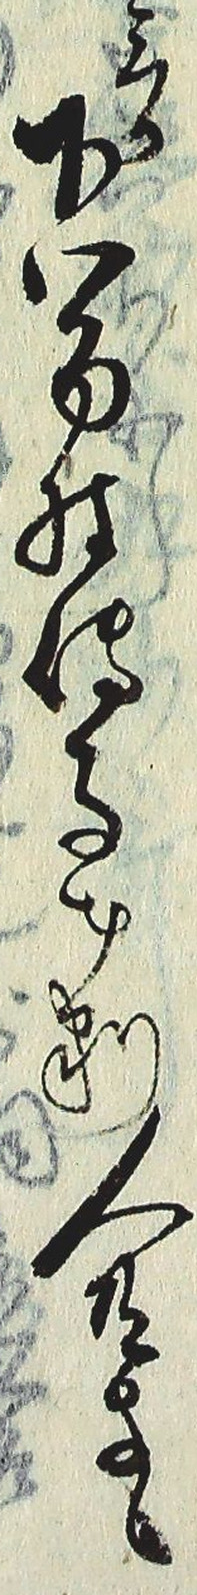下八万村伝馬才判人共方へ
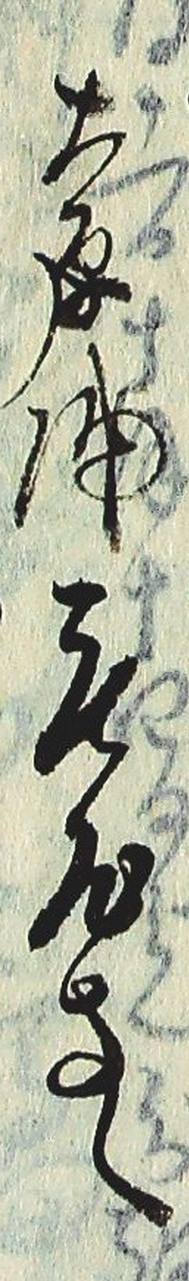大原浦庄屋方へ
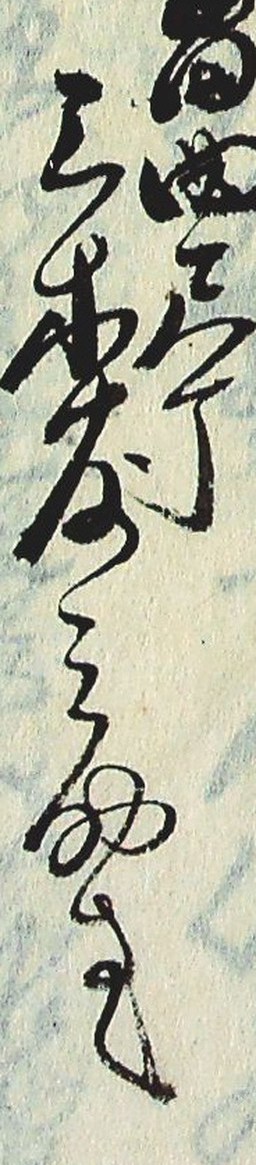三木友之助方へ
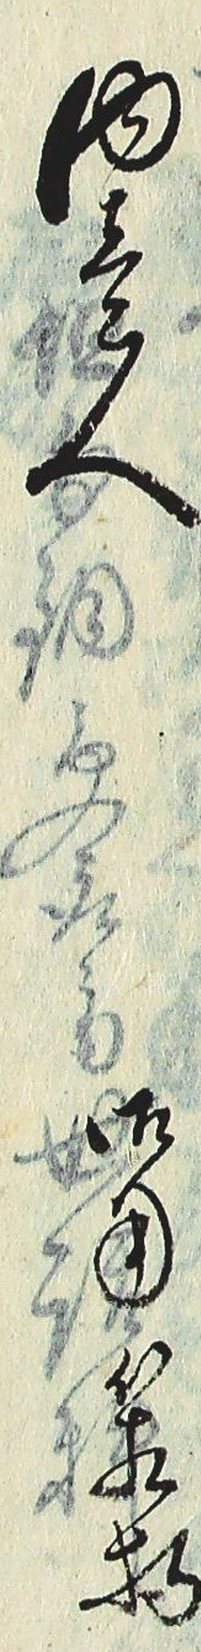内壱人御用箱持

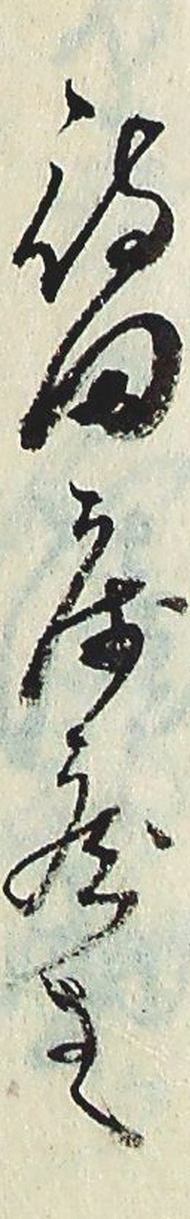待田茂蔵方へ
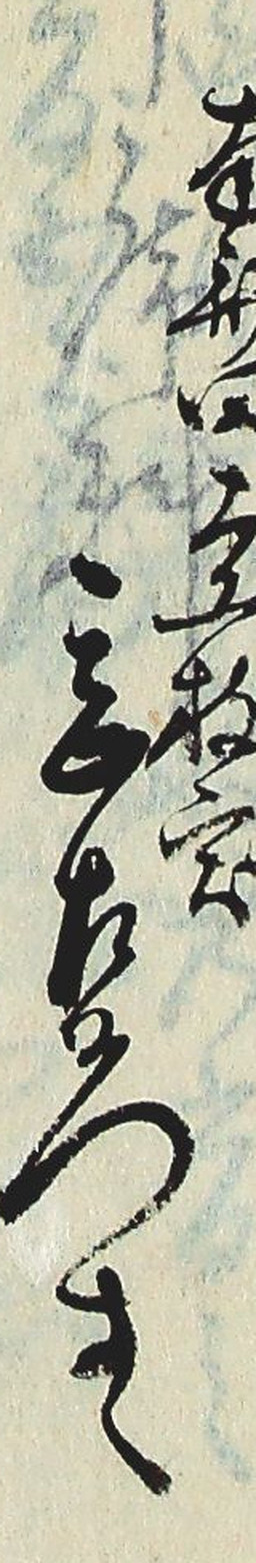甚左衛門方へ
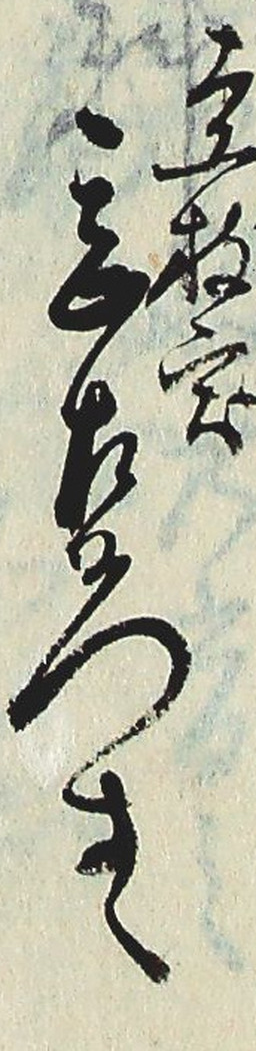甚左衛門方へ
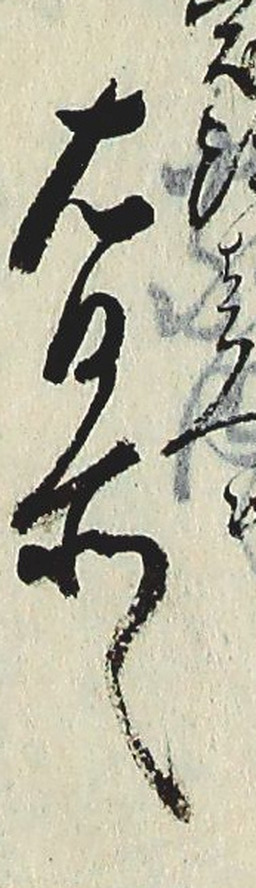右同所へ
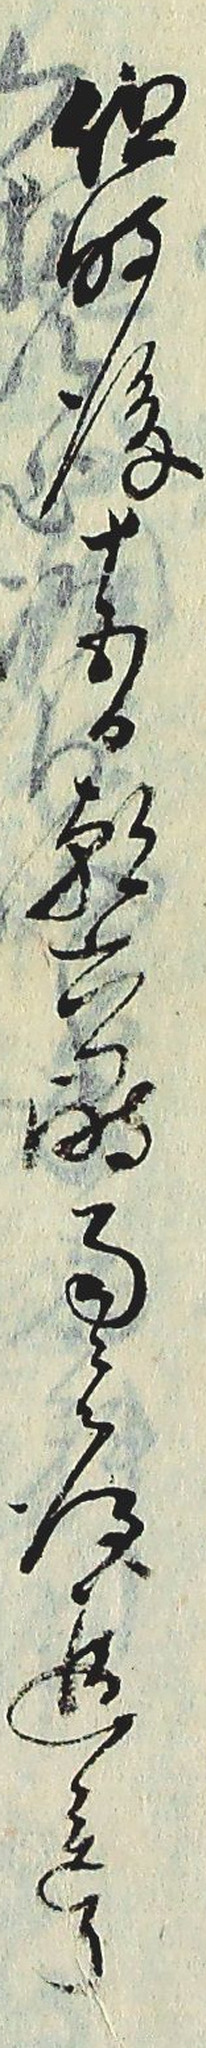但明後十五日朝六つ時雨に候得は追送り
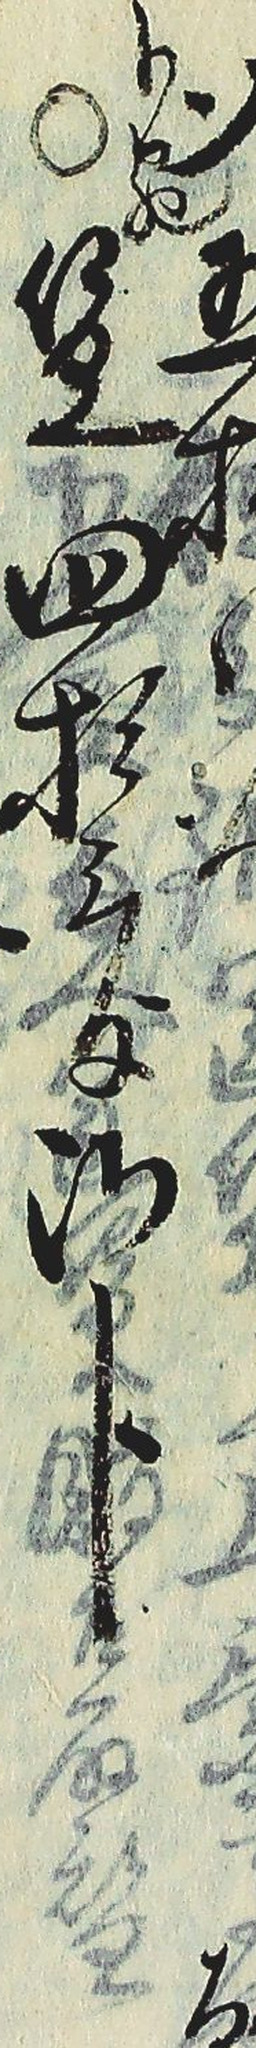賃四拾三匁弐分
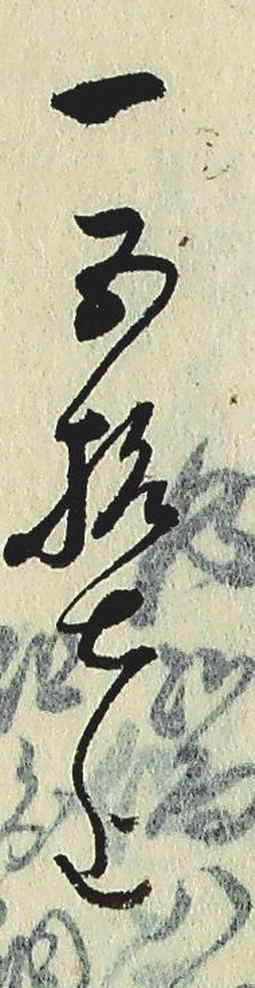一五拾七匁
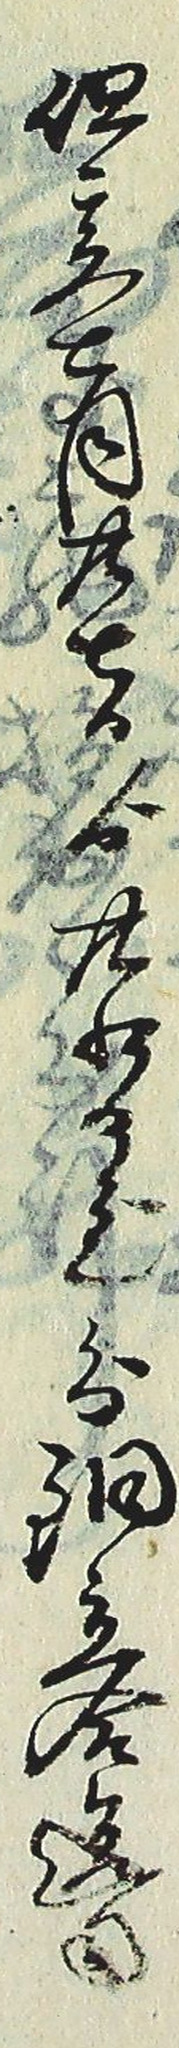但亥七月廿七日ゟ廿九日迄分銅立合造用
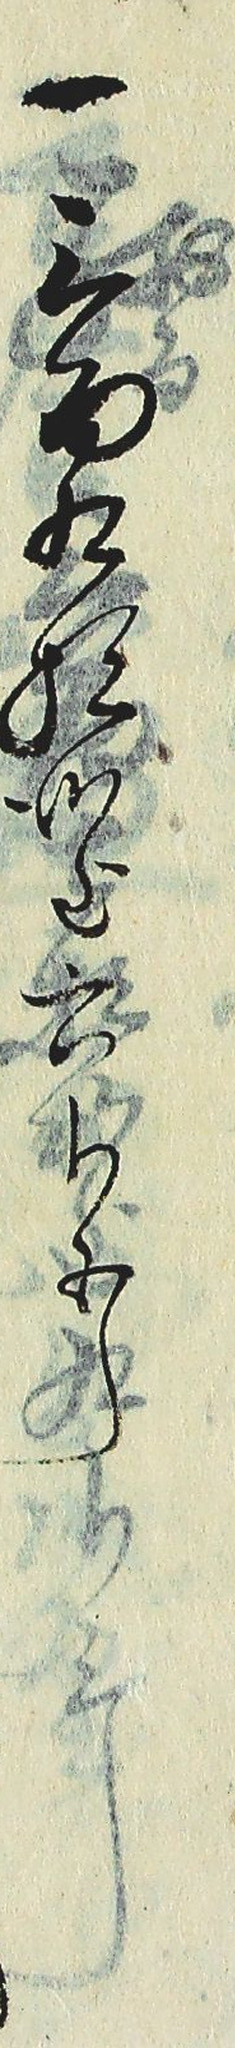一三百九拾弐匁六分五厘
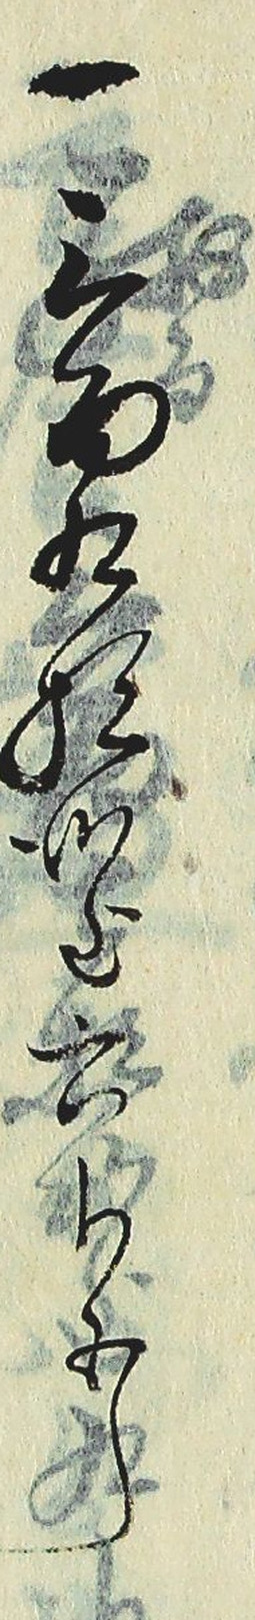一三百九拾弐匁六分五厘
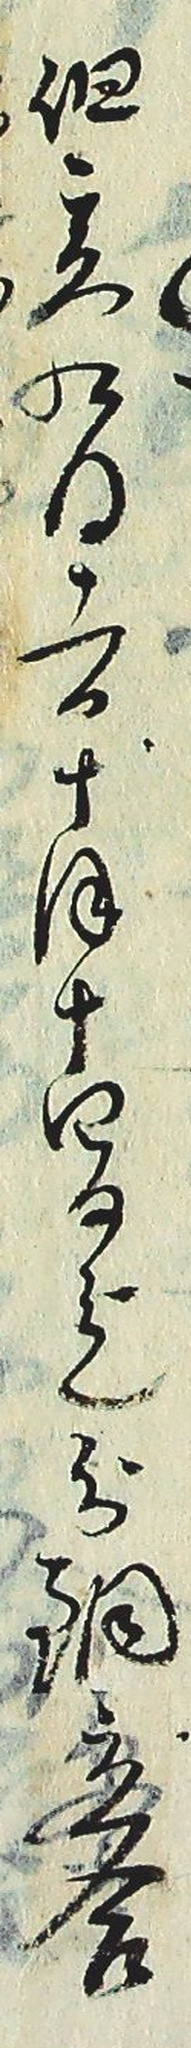但亥九月十一日ゟ十月十四日迄分銅立合
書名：名東郡中諸割賦元帳
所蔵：鳴門教育大学 Naruto University of Education
